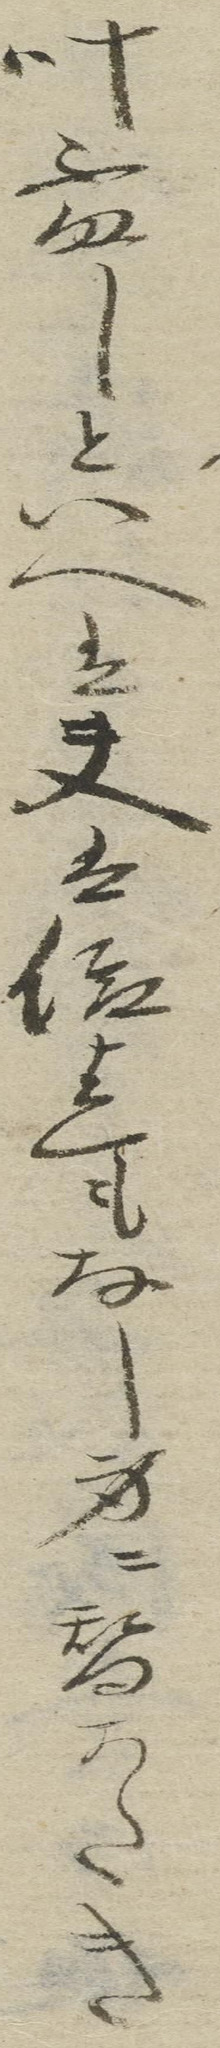叶ふましといへは夫は仰迄もなし身に替かたき
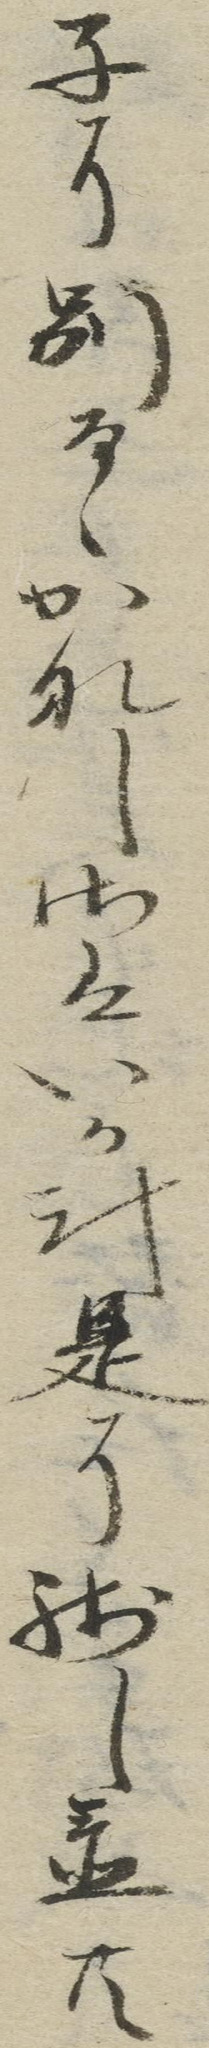子に別るゝかなしさはいか計是に残し置共
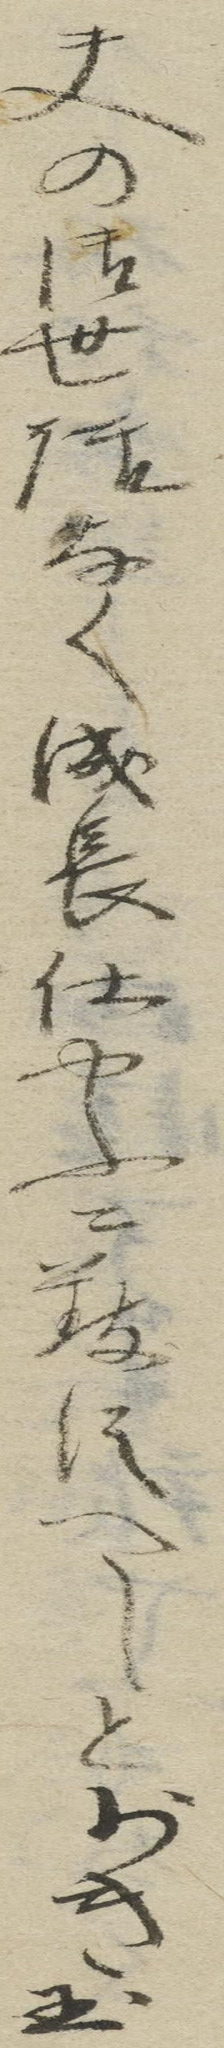夫の御世話なく成長仕やふに致すへしと少き玉
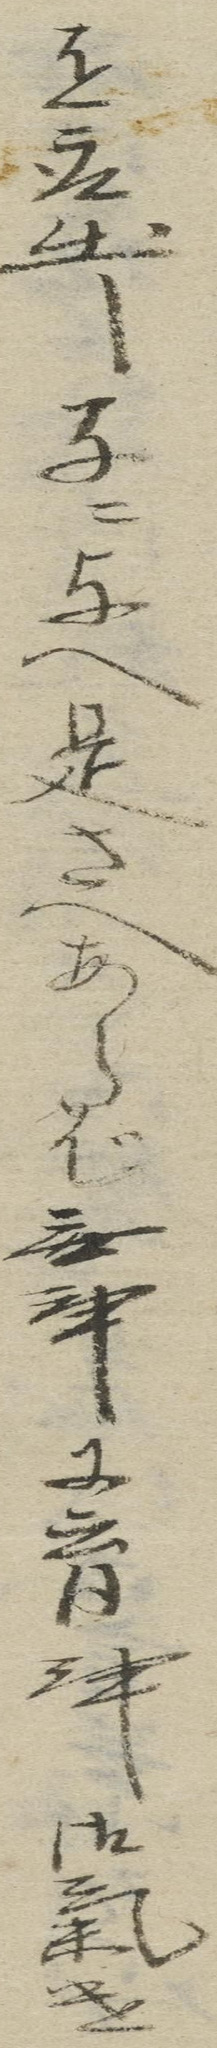を取出し子に与へ是さへあらば無事に育つ御気遣
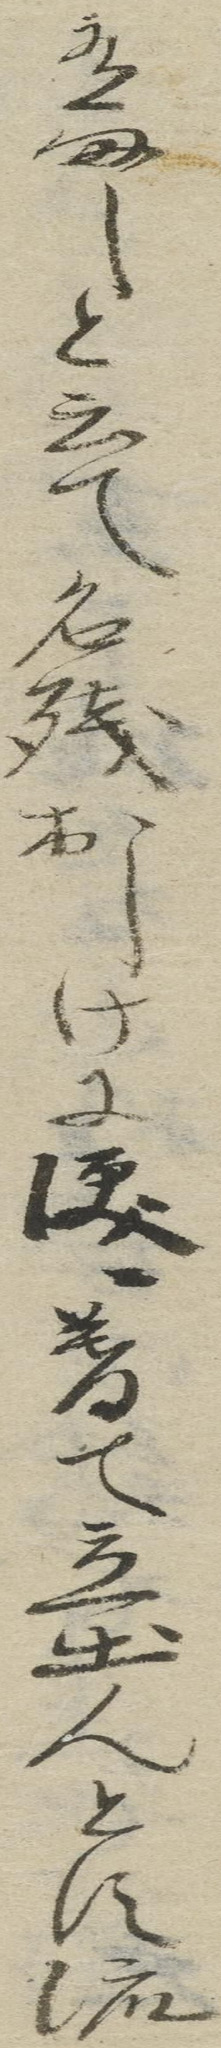有ましと云て名残おしけに涙に暮て立出んとす流
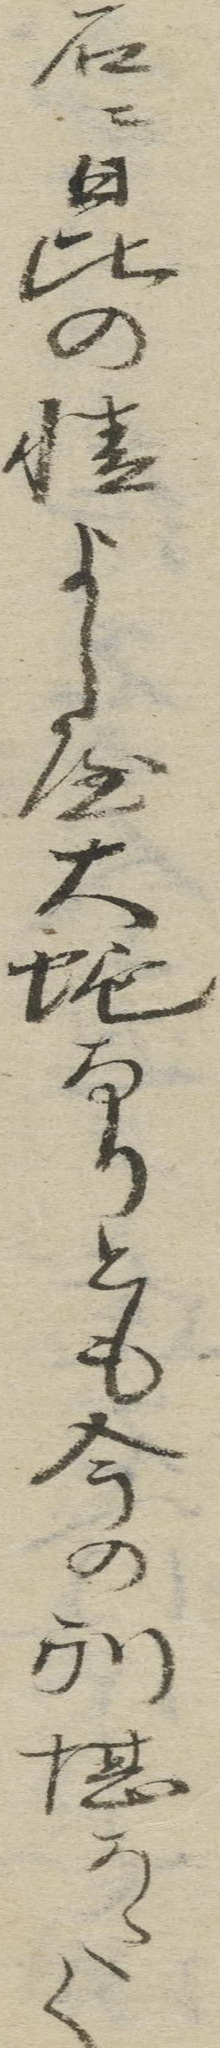石ニ日比の情よしや大蛇なりとも今の別堪えかたく
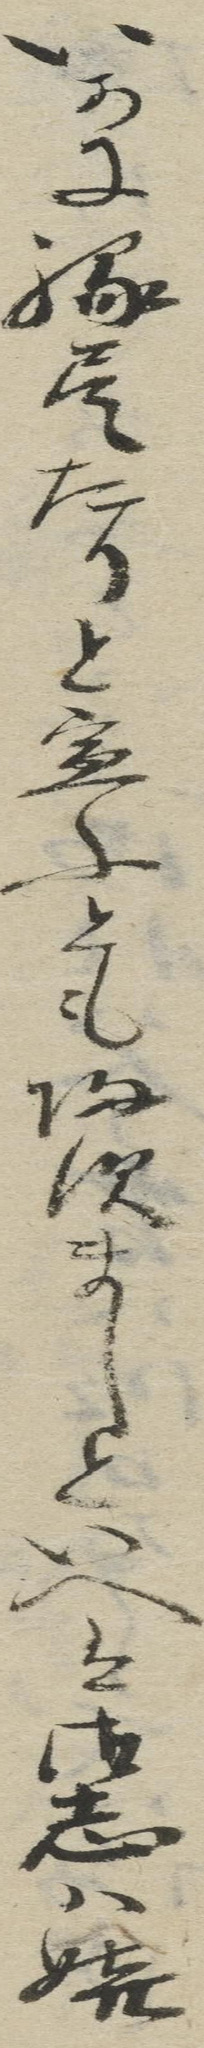いかに縁尽たりと宣ふとも帰すましといへは御志ハ嬉
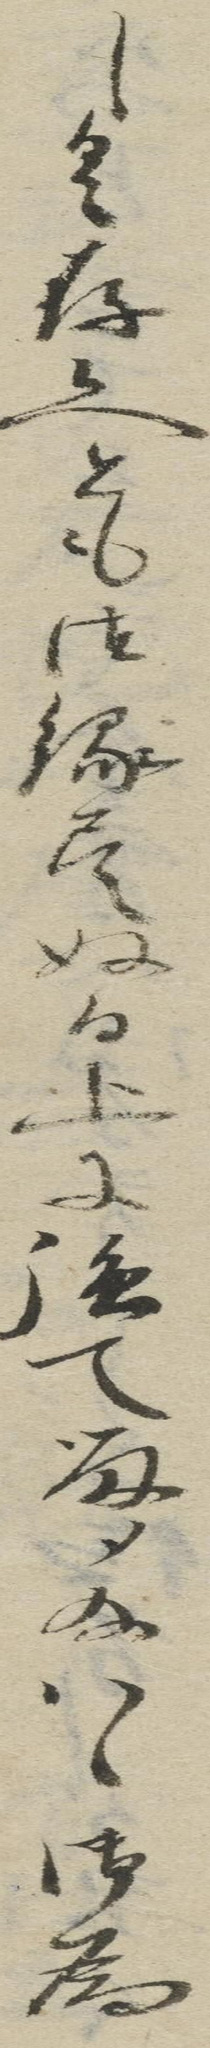しく存候へとも御縁尽ぬる上に強て留メ給ハヽ御為
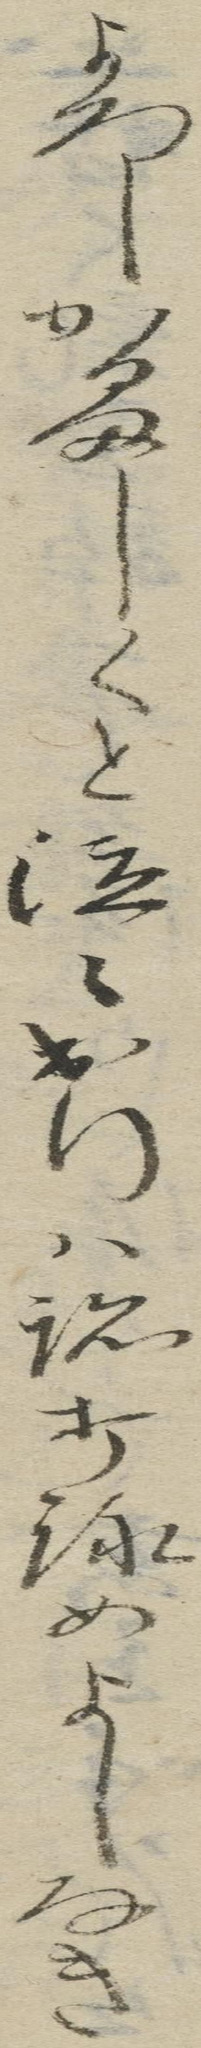よろしかるましくと泣〻出行ハ跡打やめよしなき
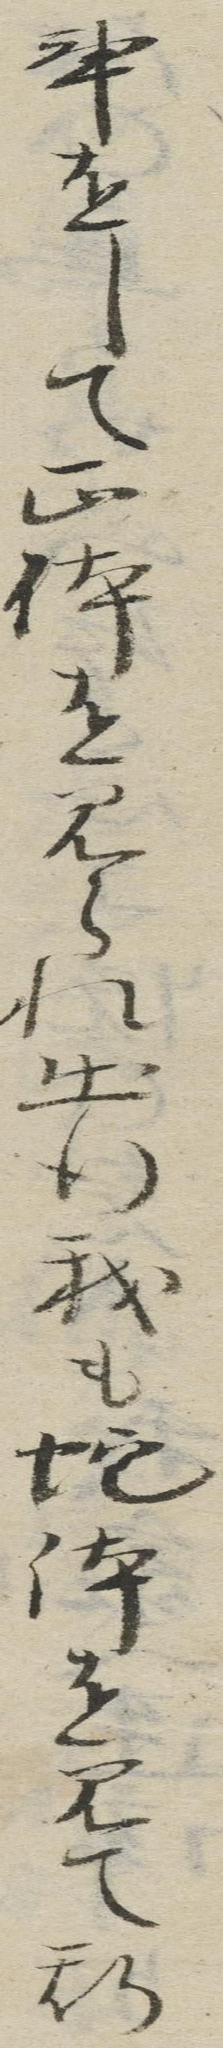事をして正体を見られ出行我も蛇体を見て斯
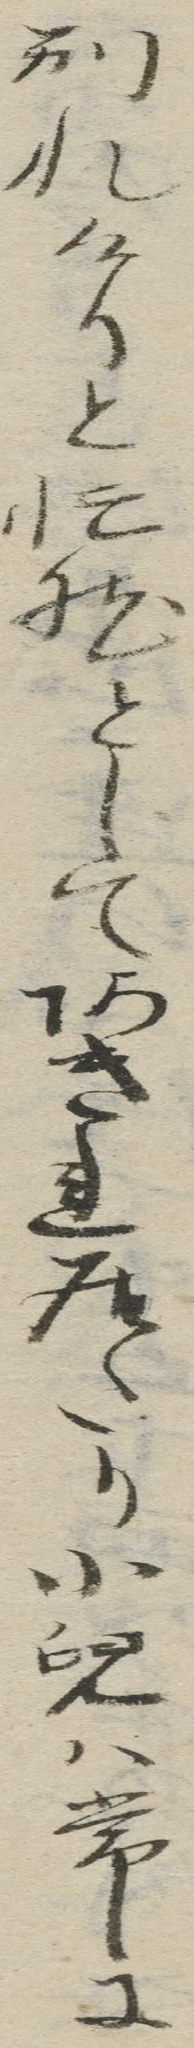別れけりと忙然としてあきれ居たり小児ハ帯に
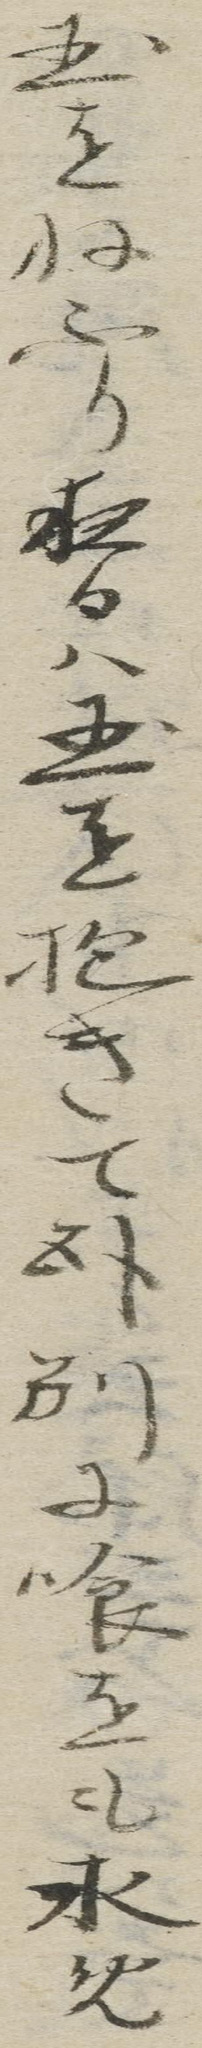玉をねふり夜るは玉を抱きて臥別に喰をも求め
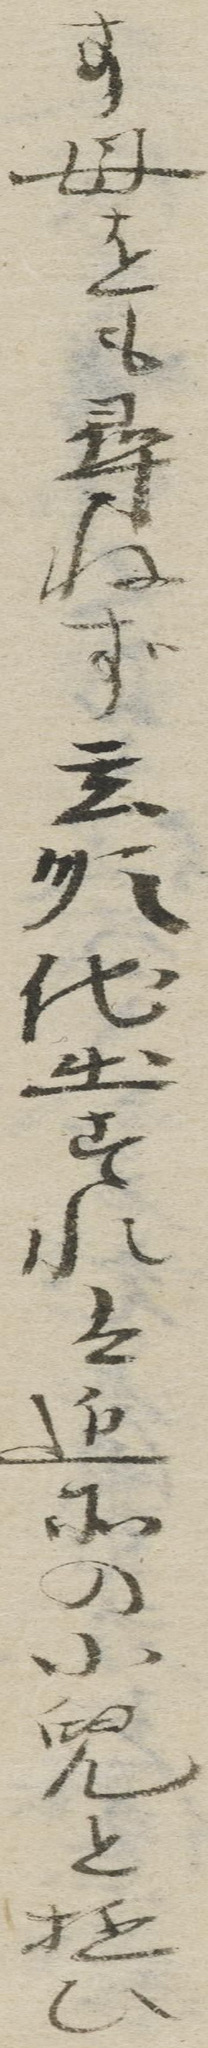す母をも尋ねず玄順他出すれは近所の小児と遊ひ
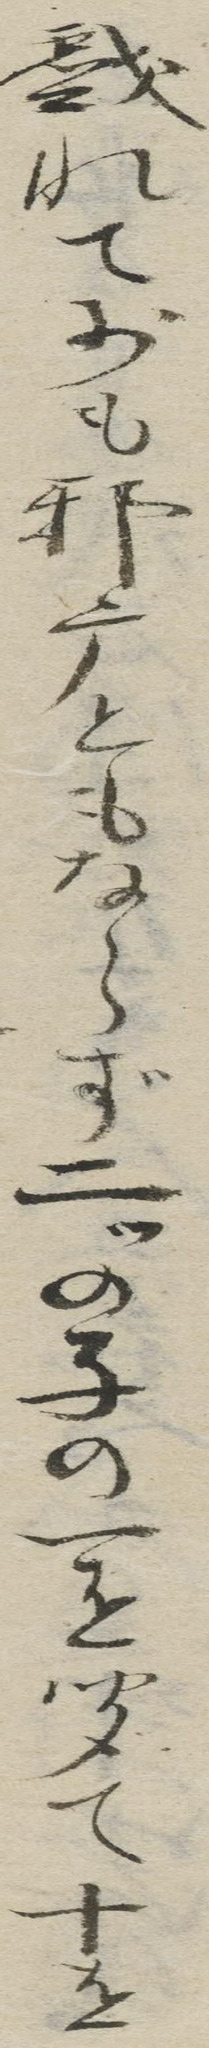戯れて少も邪魔ともならず二ツの子の一を聞て十を
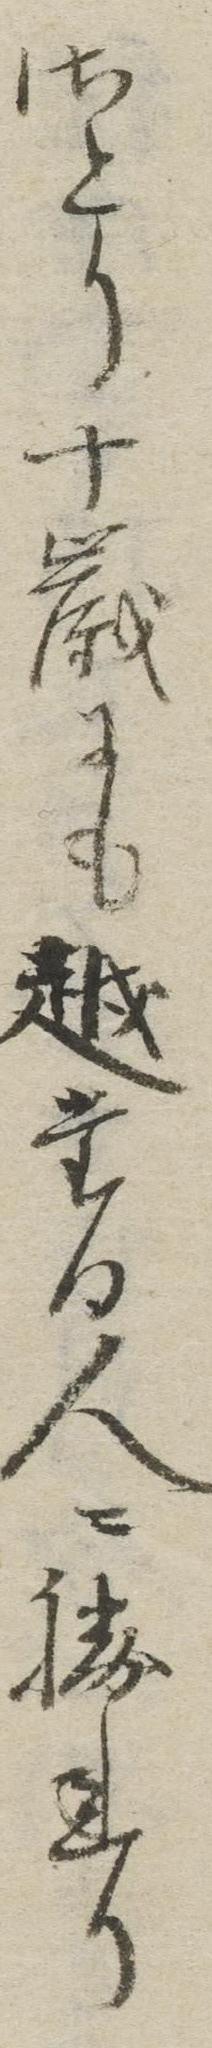さとり十歳にも越たる人に勝れり
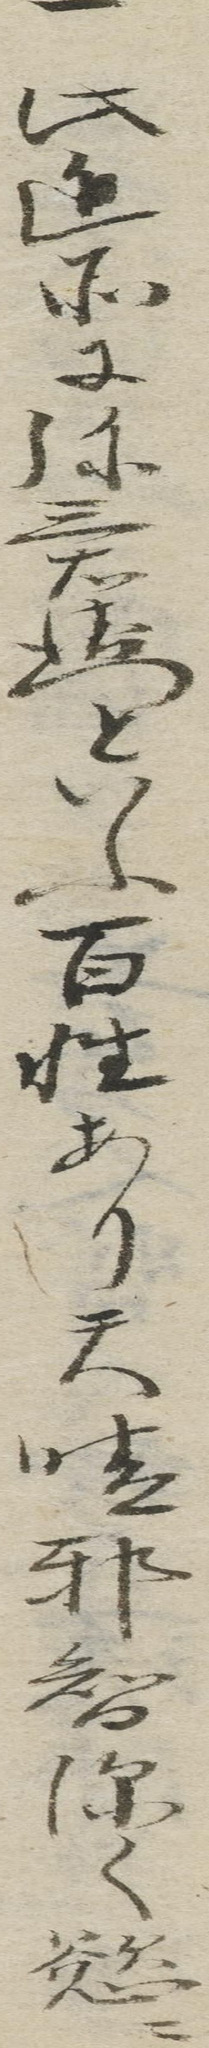一此近所に弥三右衛門といふ百姓あり天晴邪智深く欲に
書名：肥前國島原領普賢山大変記　完
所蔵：東京大学地震研究所図書室 Earthquake Research Institute Library, The University of Tokyo, JAPAN
